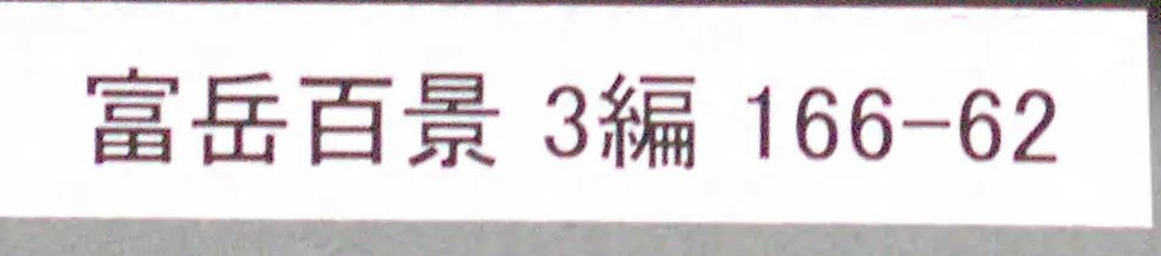富嶽百景一

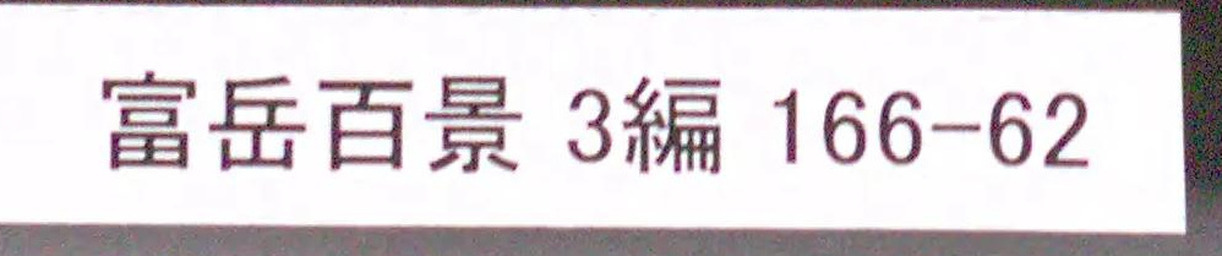富嶽百景編

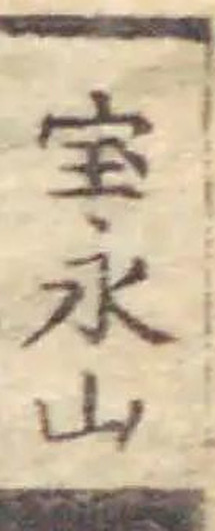宝永山
